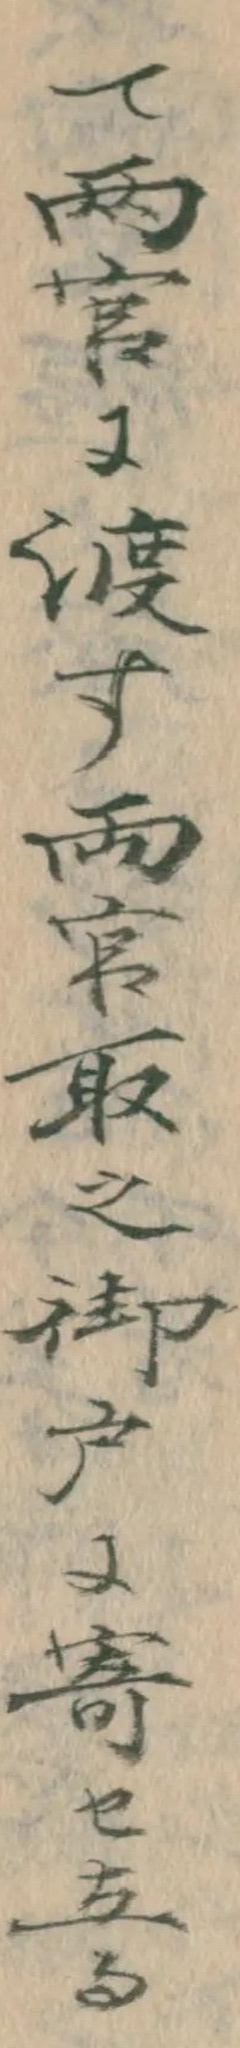て両官に渡す両官取之御戸に寄せ立る
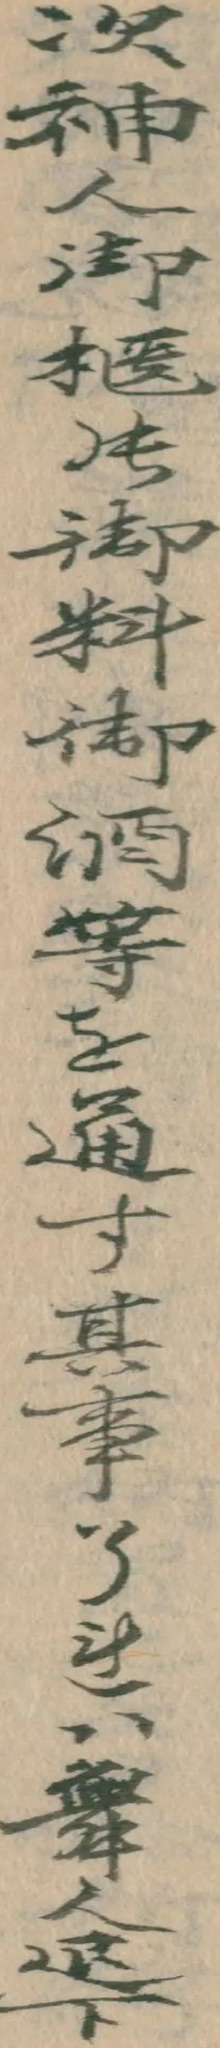次神人御櫃の御料御酒等を通す其事了れは舞人退下
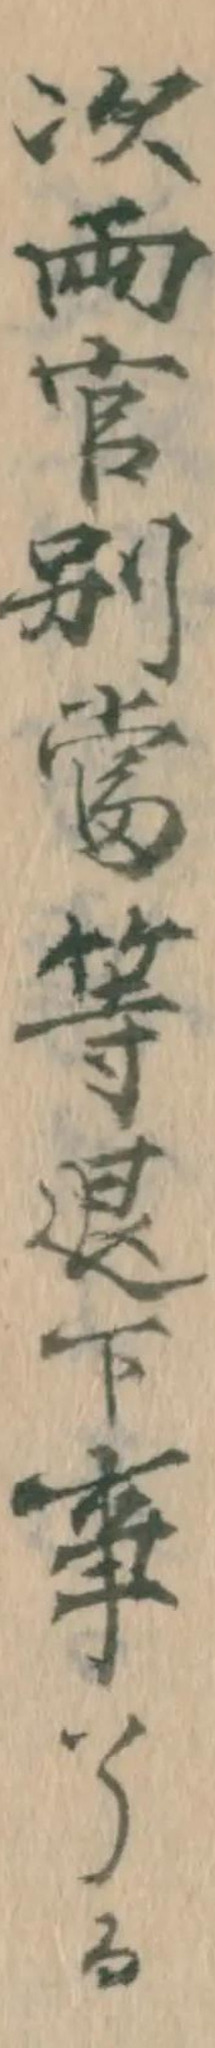次両官別当等退下事了る
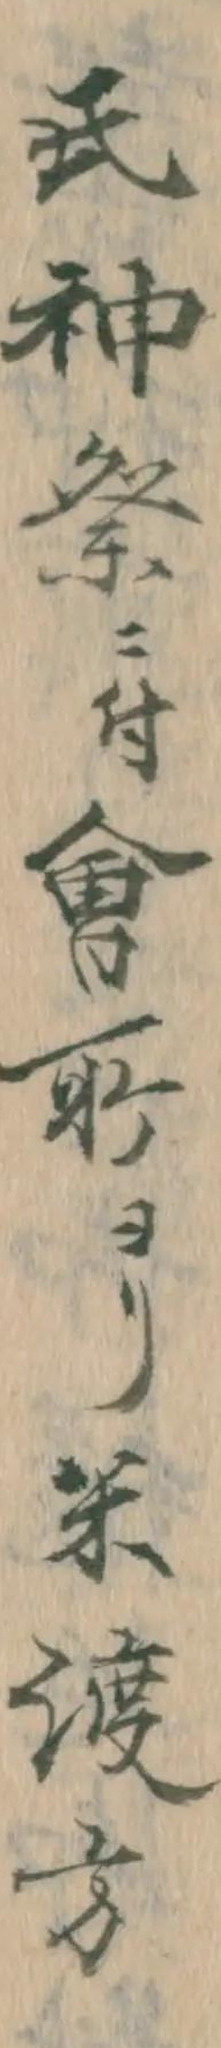氏神祭に付会所ヨリ米渡方
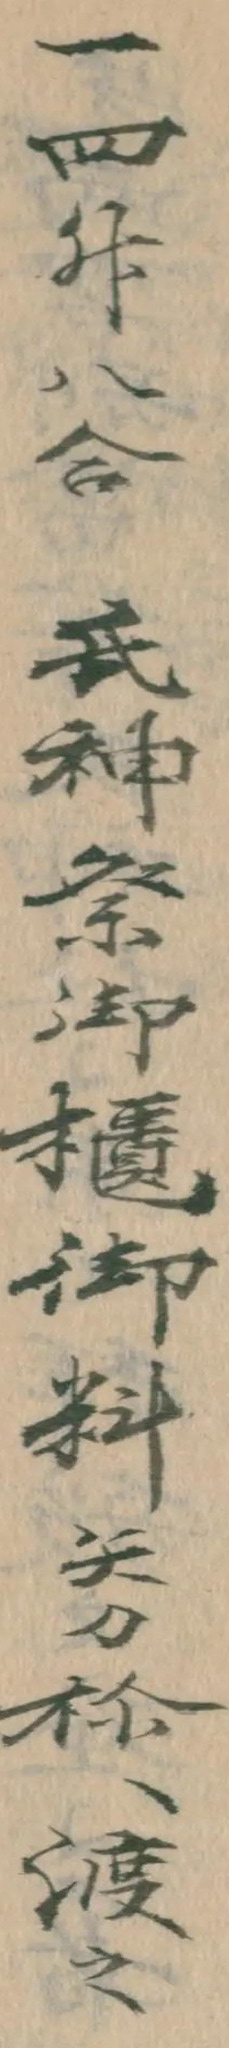一四升八合氏神祭御櫃御料矢刀祢へ渡之
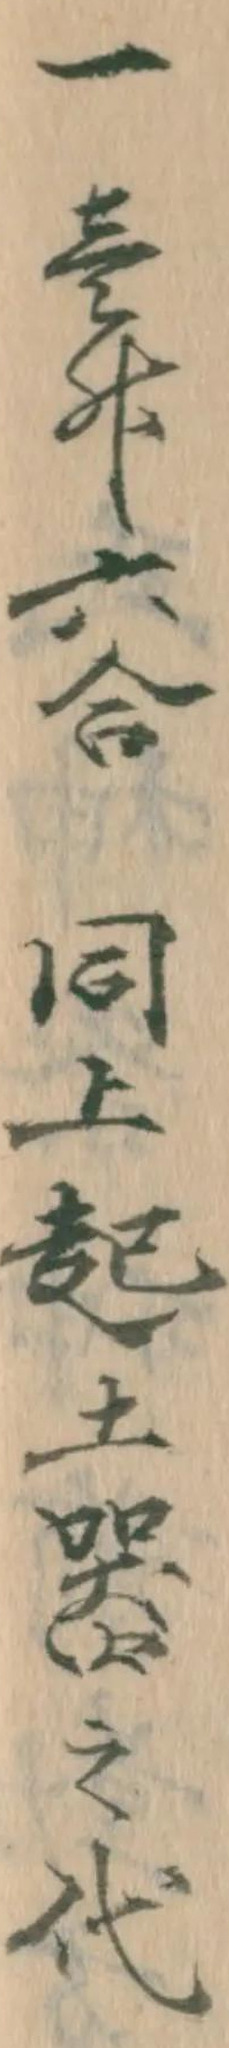一壱升六合同上起土器之代
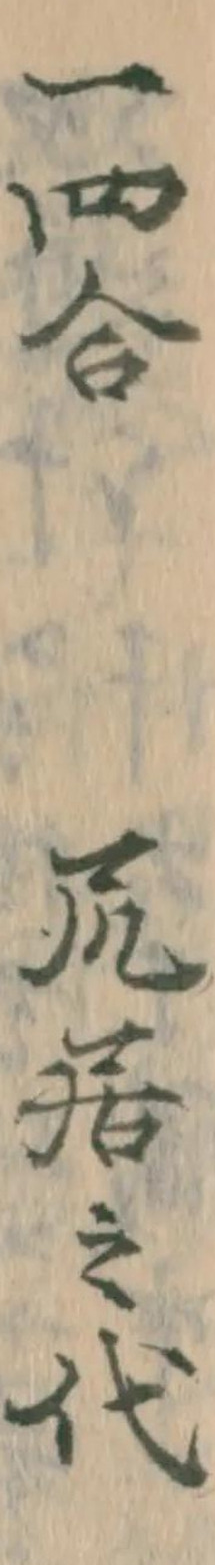一四合尻居之代
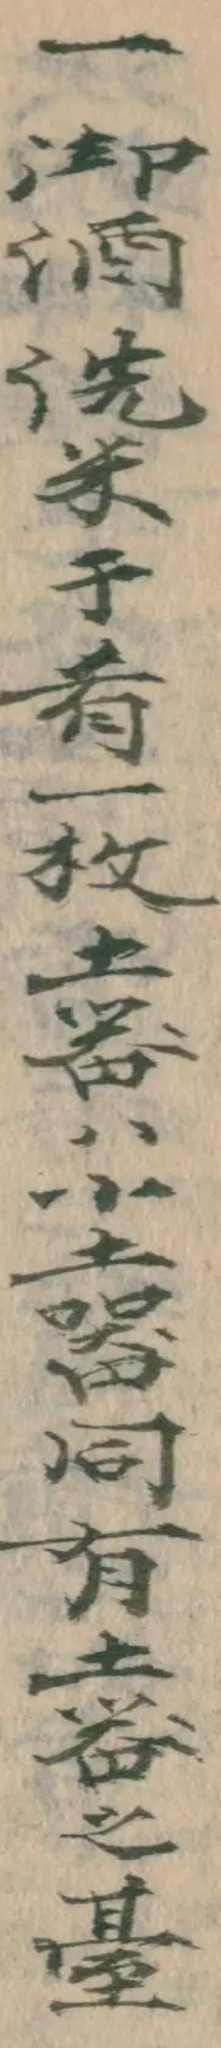一御酒洗米于肴一枚土器は小土器同有土器之台
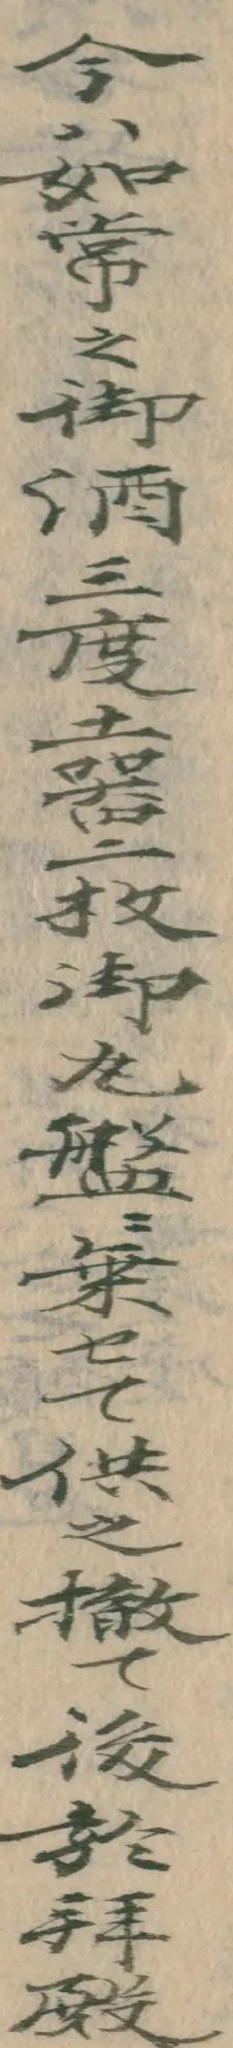今は如常之御酒三度土器二枚御丸盤ニ乗せて供之撤て後於拝殿
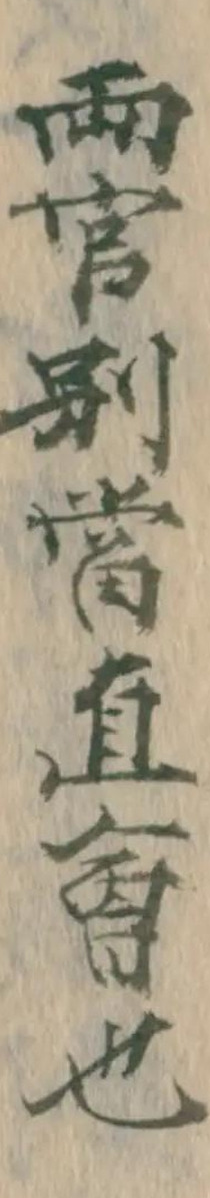両官別当直会也
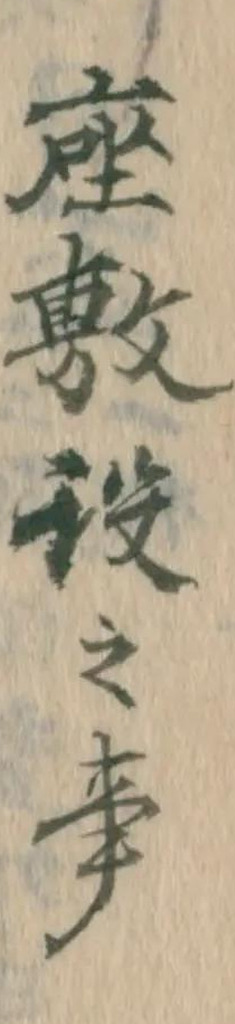座敷役之事
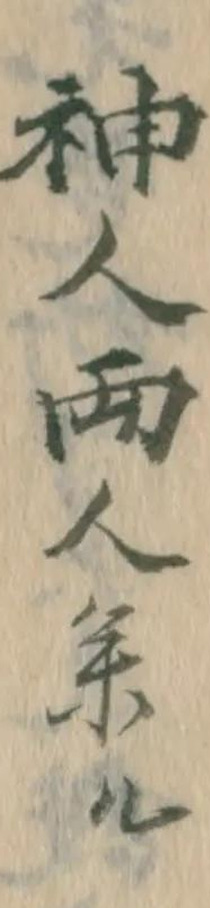神人両人参ル
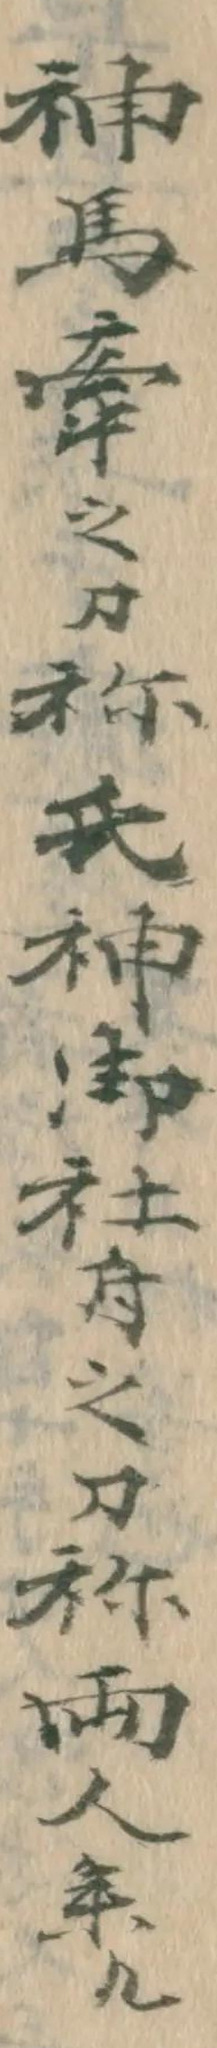神馬牽之刀祢氏神御社付之刀称両人参ル
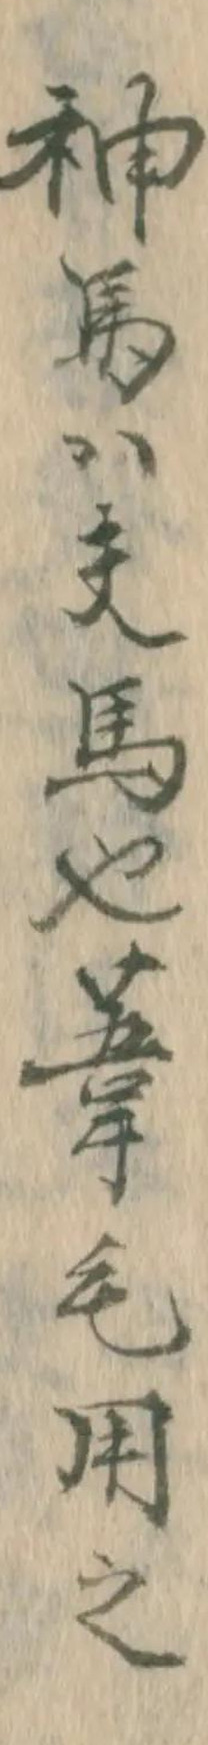神馬は夫馬也葦毛用之
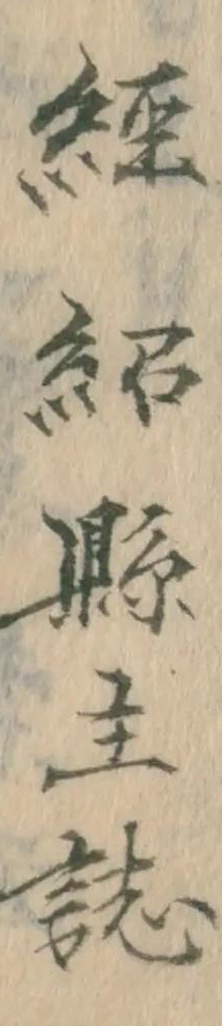経紹県主誌

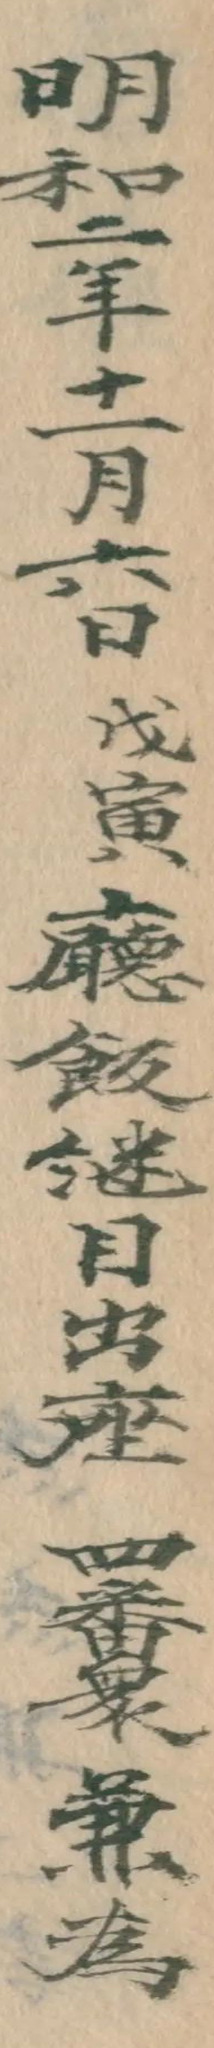明和二年十一月六日戊寅庁飯継目出座四番衆兼為
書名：賀茂社記録. 第9冊
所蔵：国立国会図書館 National Diet Library, JAPAN
